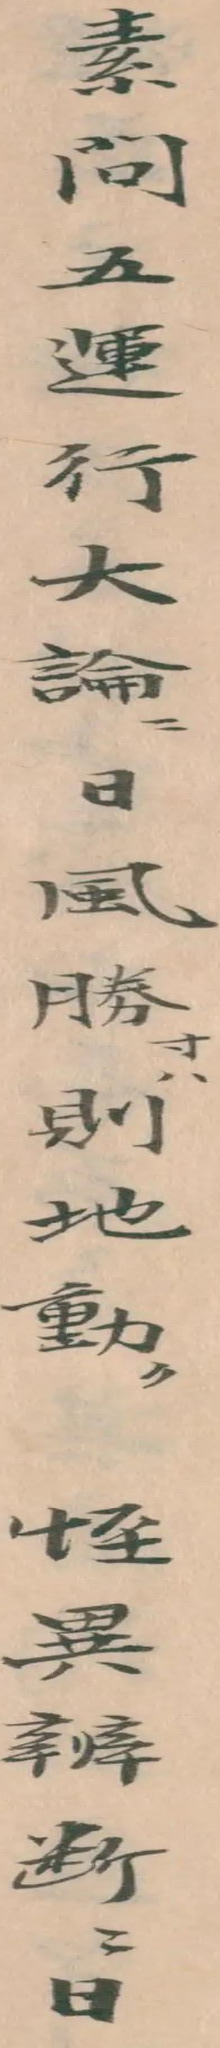素問五運行大論曰風勝則地動怪異弁断曰
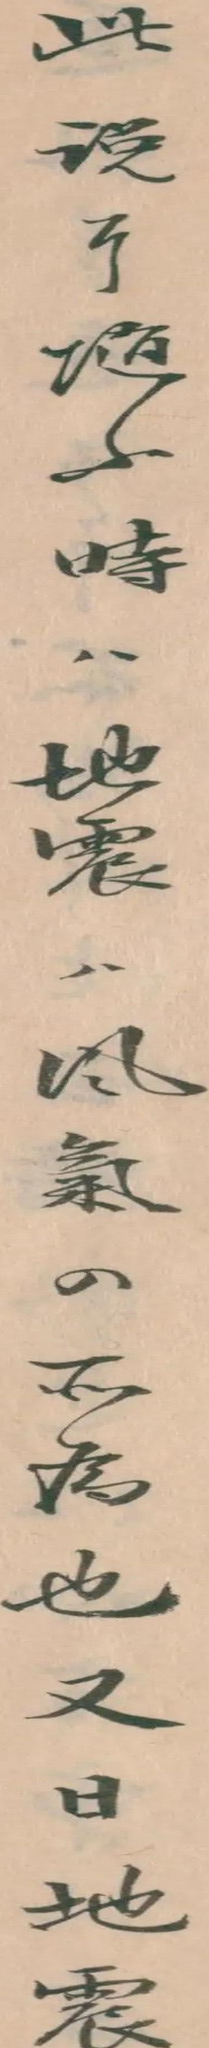此説に随ふ時は地震は風気の所為也又曰地震
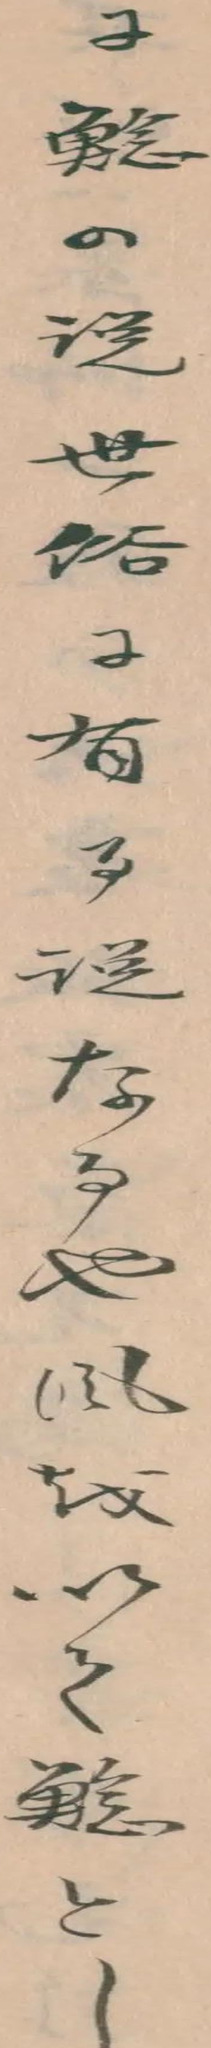に鯰の説世俗に有る説なるや風を以て鯰とし
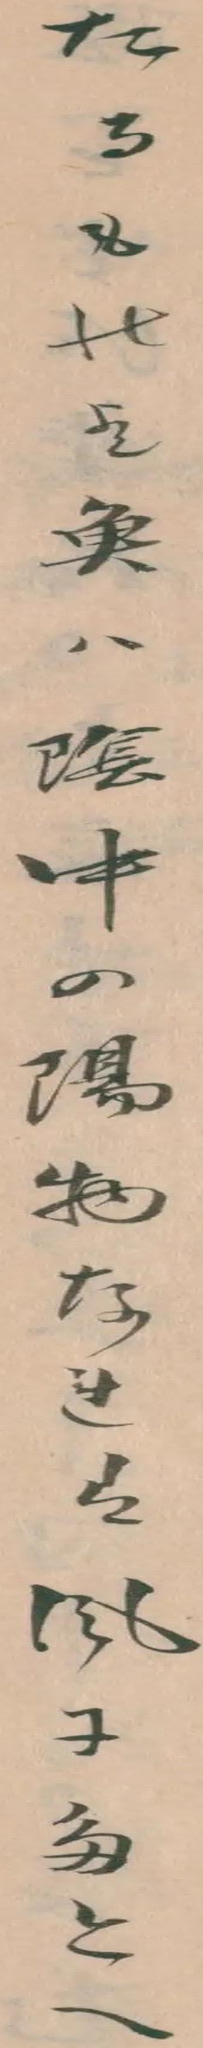たるものか魚は陰中の陽物なれは風にたとへ
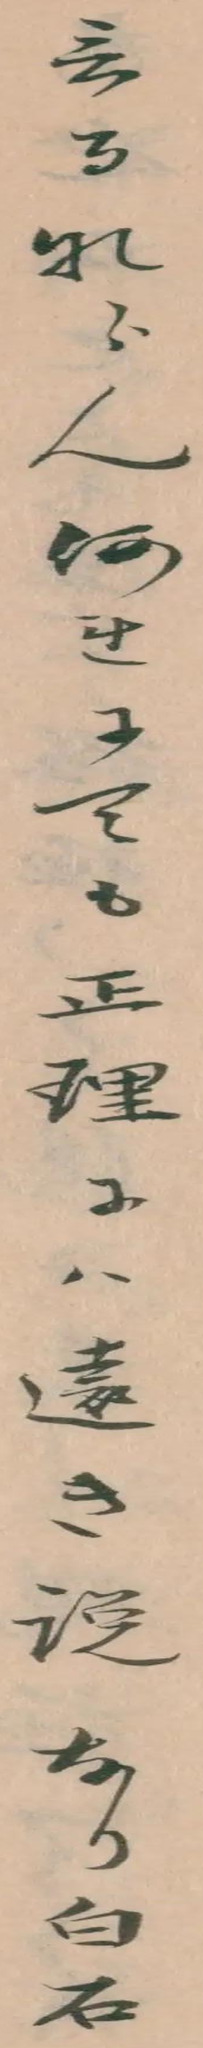言るならん何れにても正理には遠き説なり白石
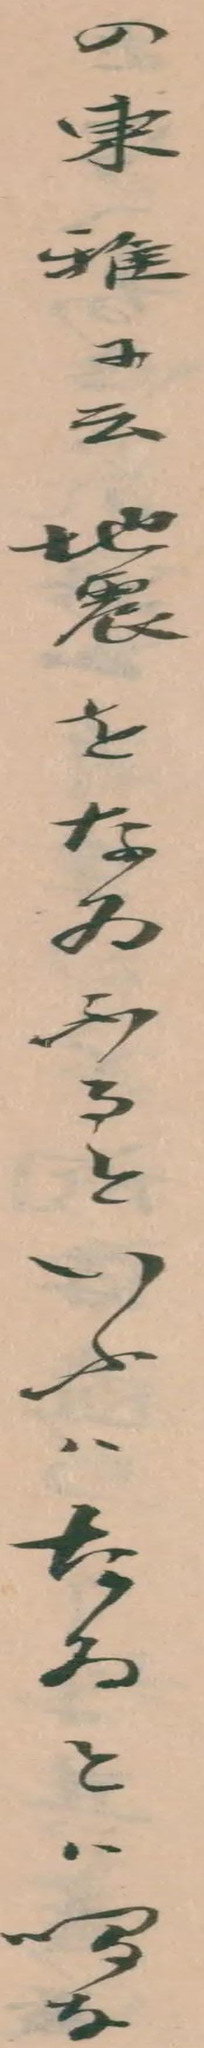の東雅に云地震をなゐふるといふはなゐとは鳴な
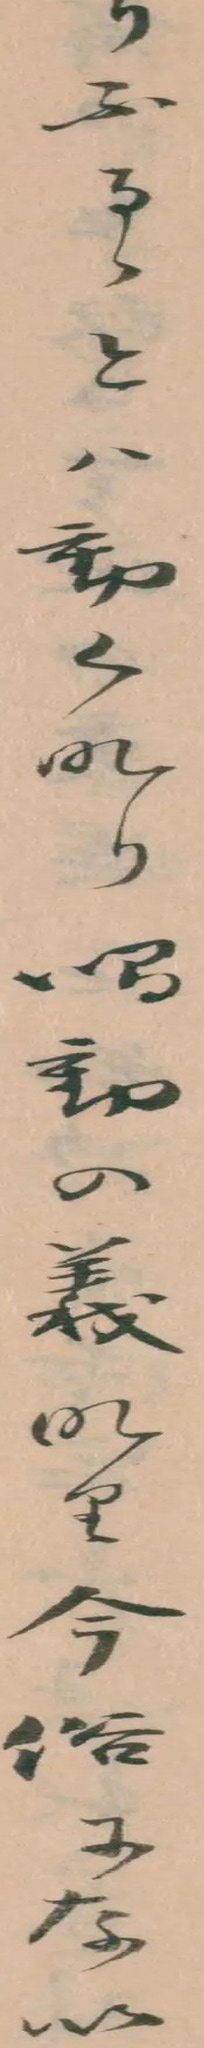りふるゝとは動くなり鳴動の義なり今俗にない
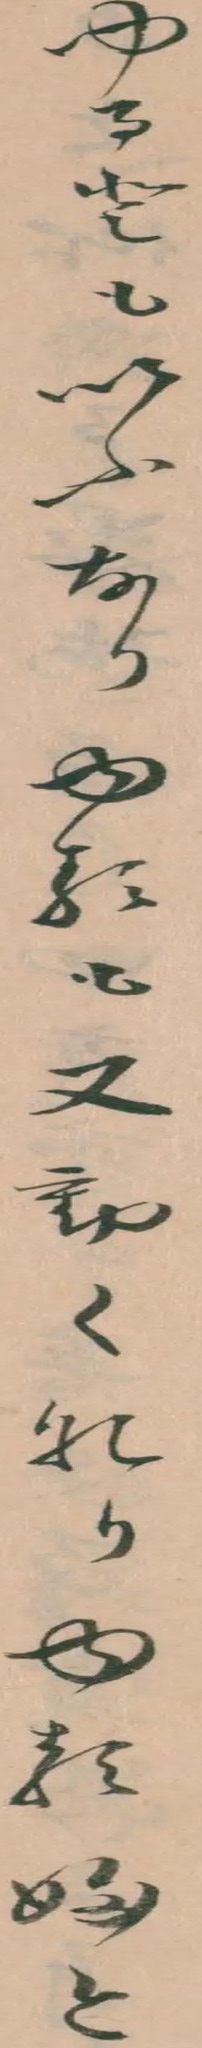ゆるともいふなりゆるも又動くなりゆるふと
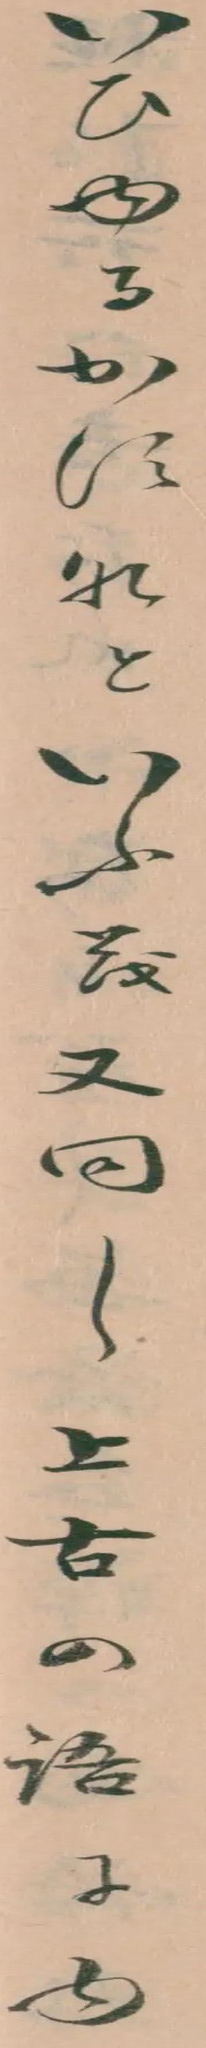いひゆるかすなといふも又同し上古の語にゆ
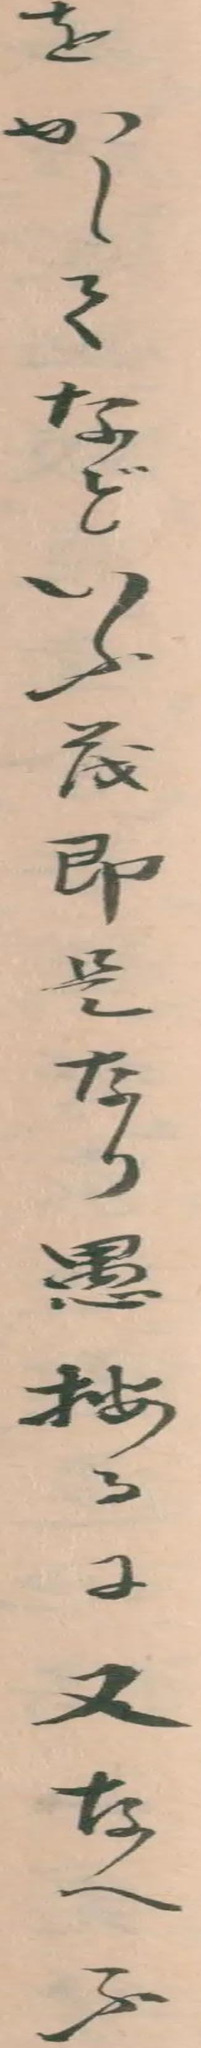をかしてなどいふも即是なり愚按るに又なへふ
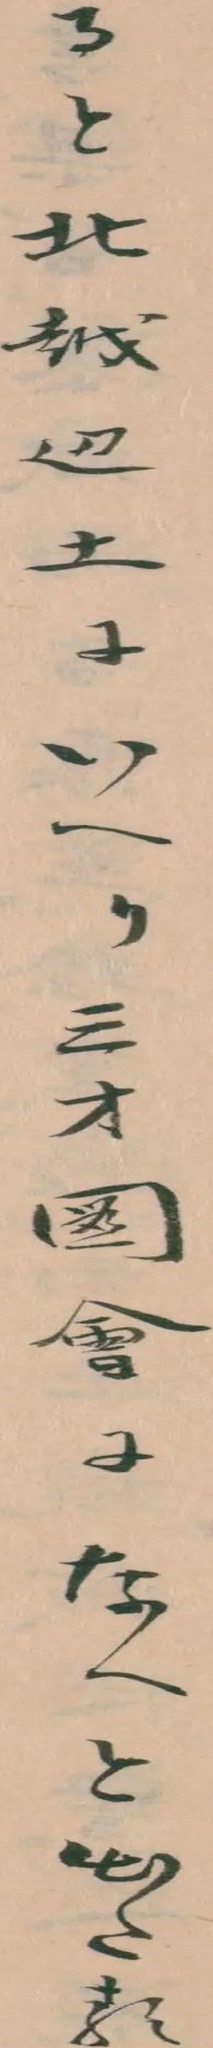ると北越辺土にいへり三才図会になへと出たる
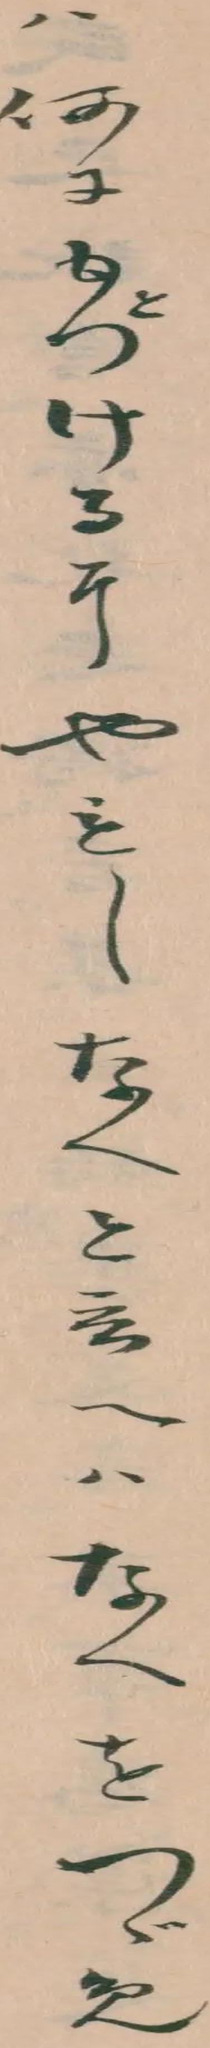は何にもとつけるにやもしなへと言へはなへをつゞめ
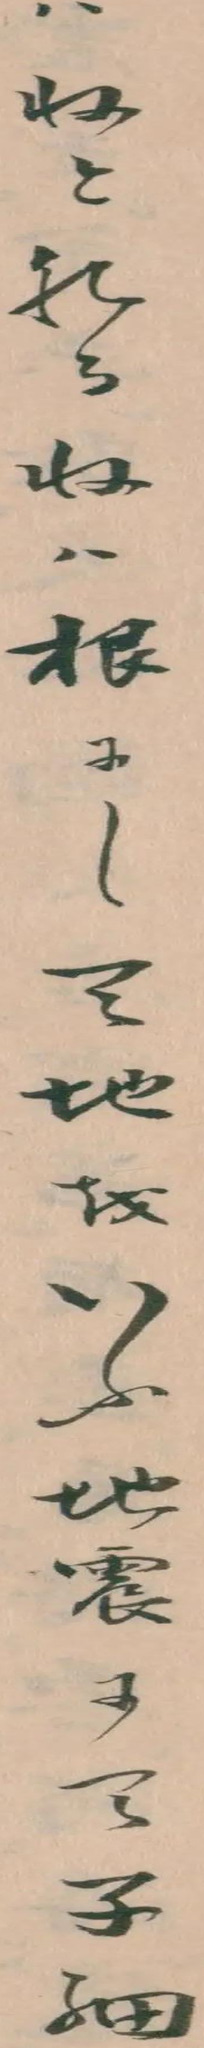はねとなるねは根にして地をいふ地震にて子細
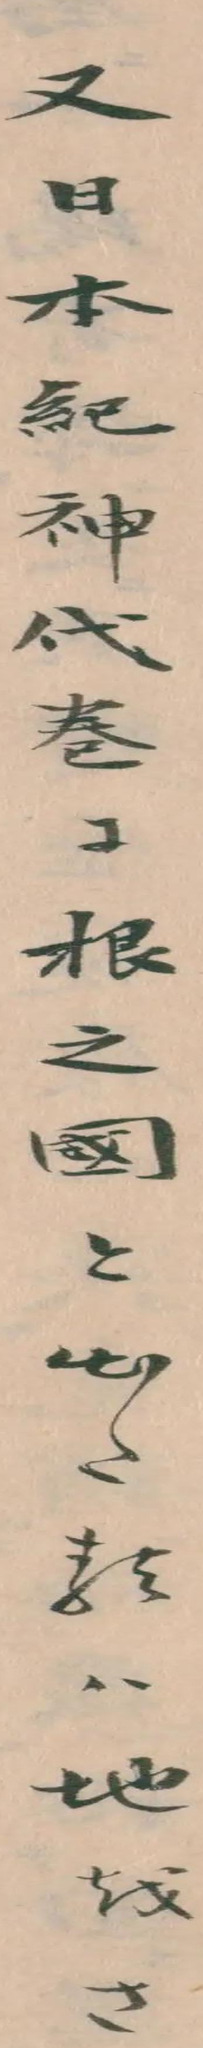又日本紀神代巻に根之国と出たるは地をさ
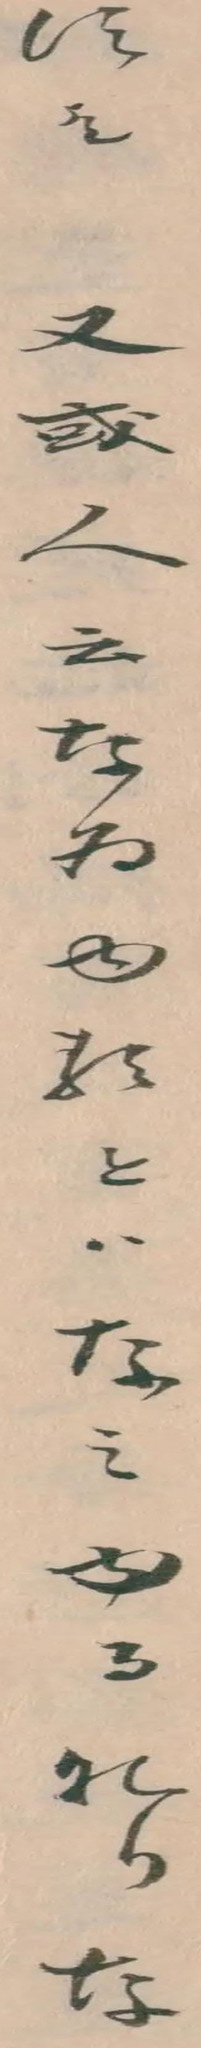すか又或人云なゐゆるとはなみゆるなりな
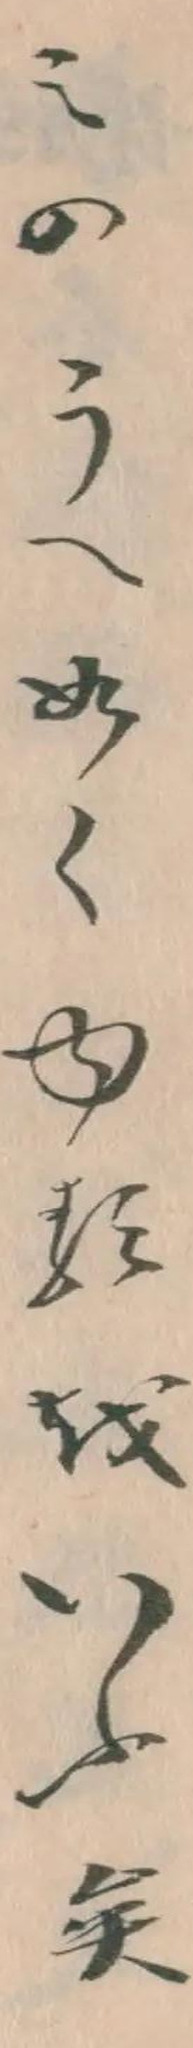みのうへ如くゆるをいふ矣
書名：地災撮要. 巻5-6(地震之部)
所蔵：国立国会図書館 National Diet Library, JAPAN
